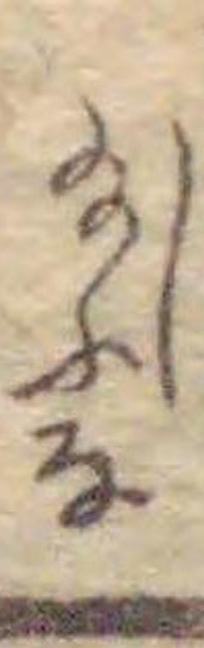給ふな
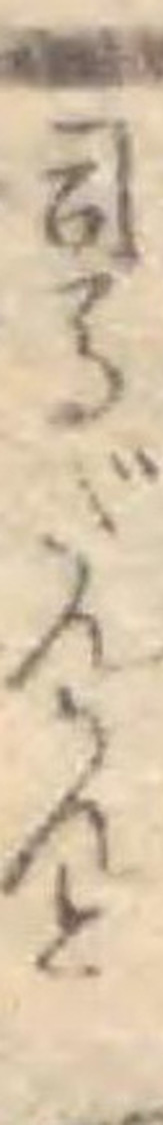司馬だんかんと
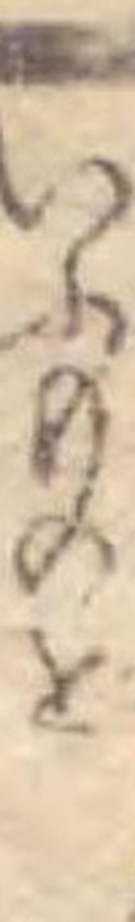いふものを
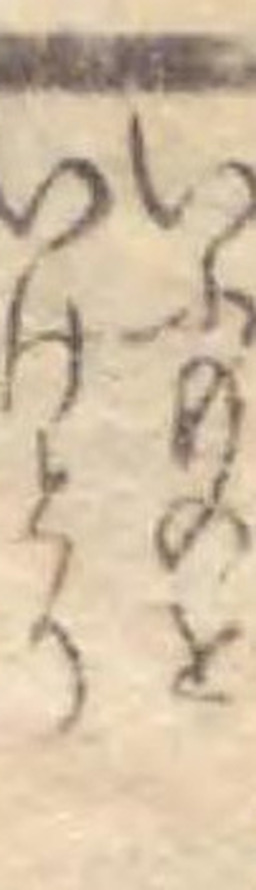いけとり
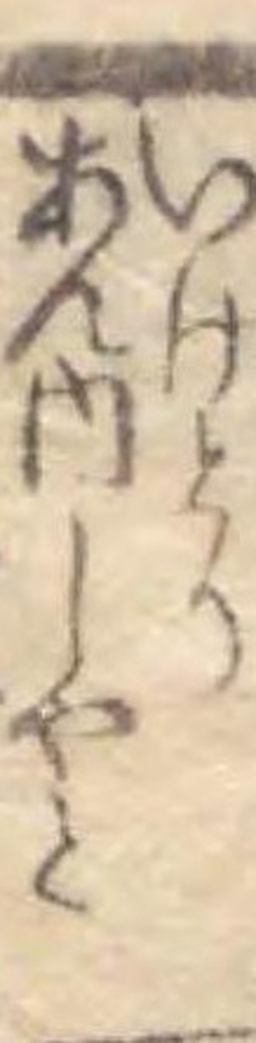あん内しやと
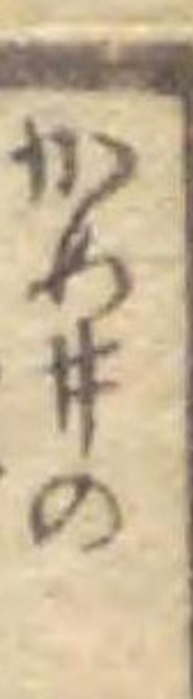かめ井の
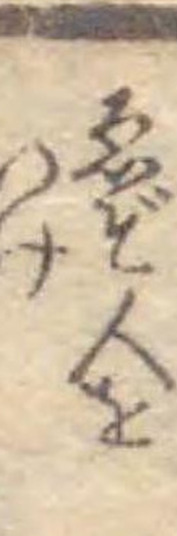ゑぞ人を
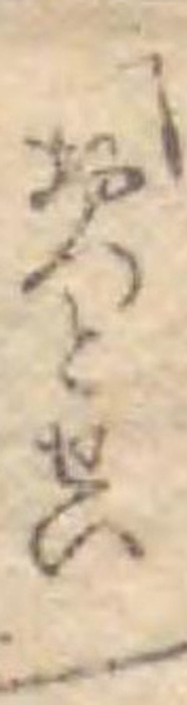〽おつとせい
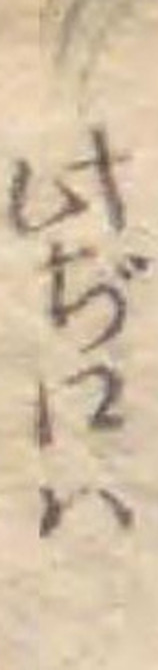此ぢ口は
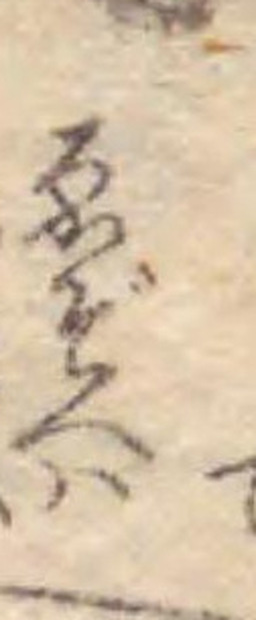ゑぞへは
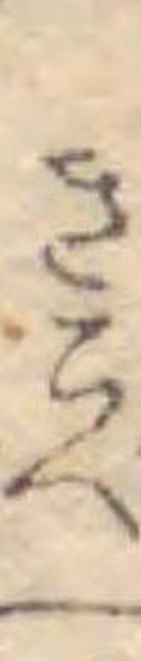きこへ

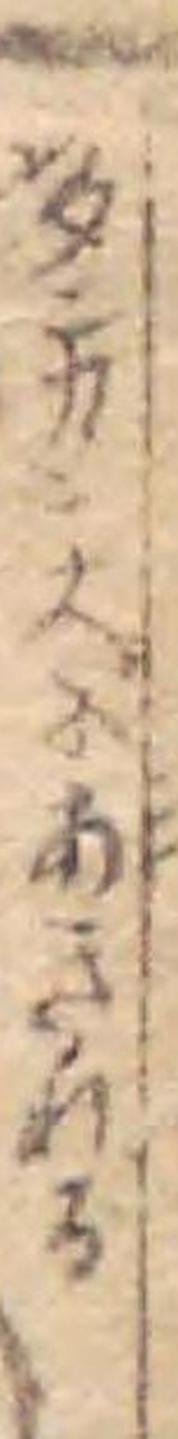タンカン大にあきれる
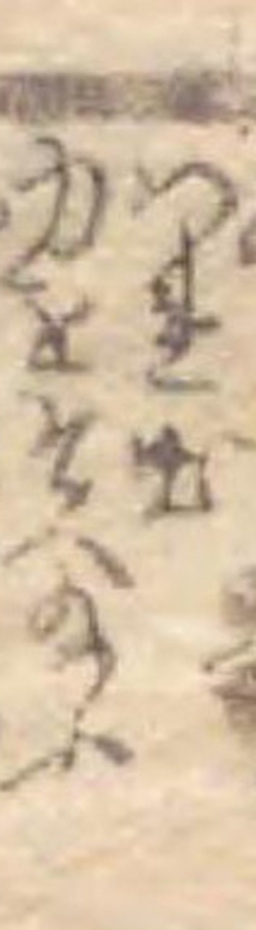力をそへ給ふ
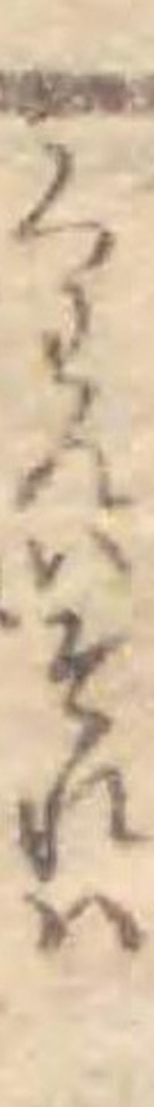くわんはそれは
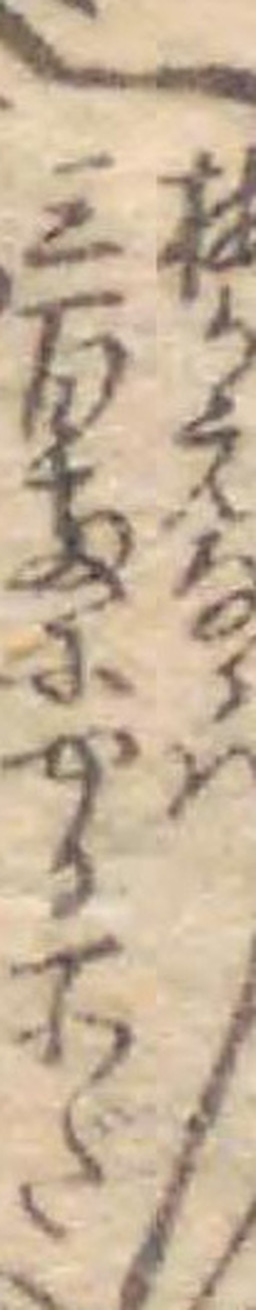三百両にやる所だ
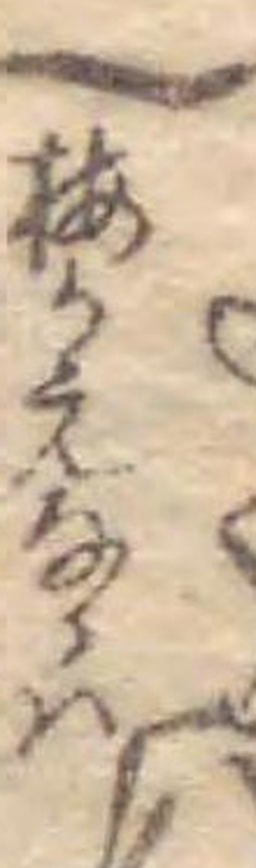梅かえならは
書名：悦贔負蝦夷押領 : 3巻
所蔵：国立国会図書館 National Diet Library, JAPAN
